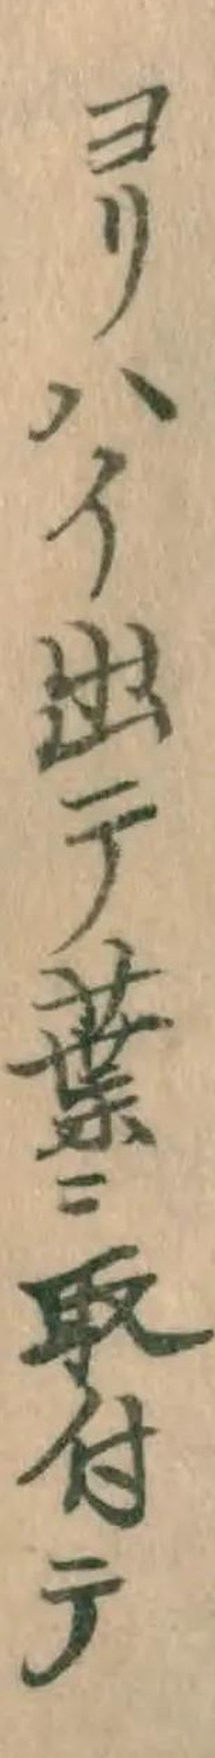ヨリハイ出テ葉ニ取付テ
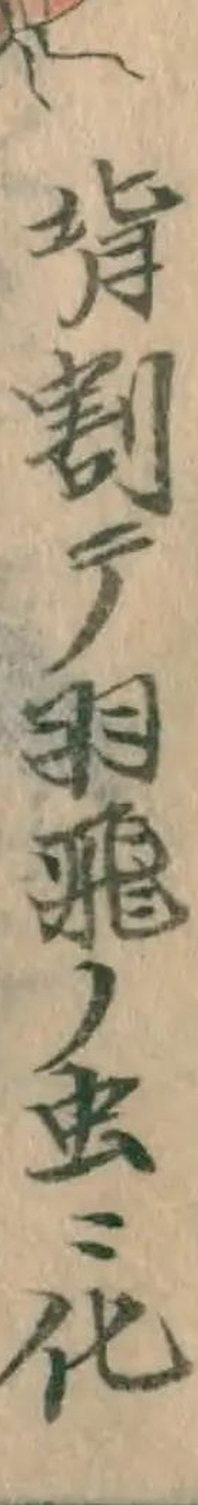背割テ羽飛ノ虫ニ化
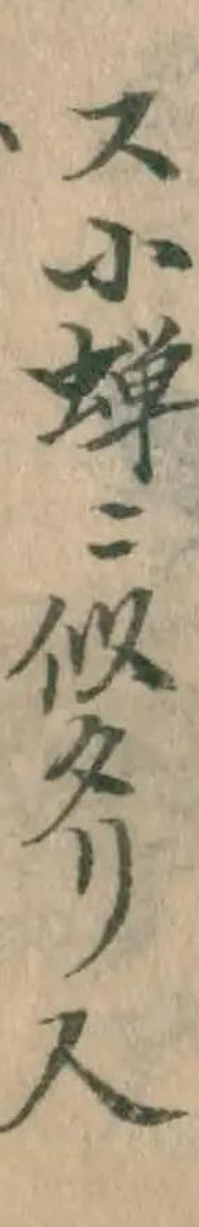ス小蝉ニ似タリ人
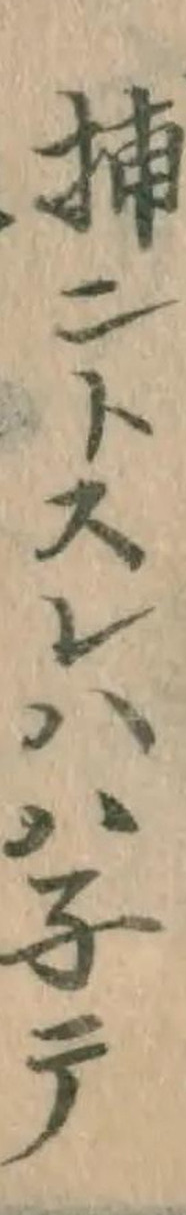捕ントスレハハネテ
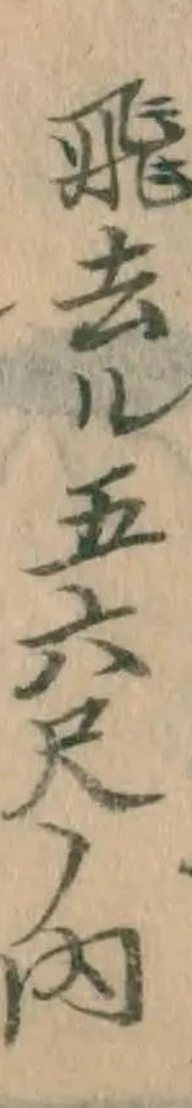飛去ル五六尺ノ内
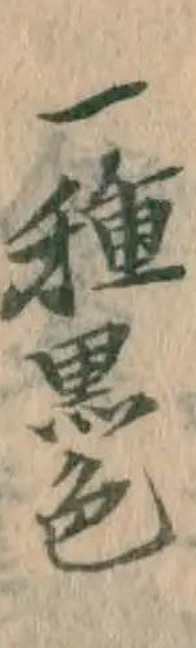一種黒色
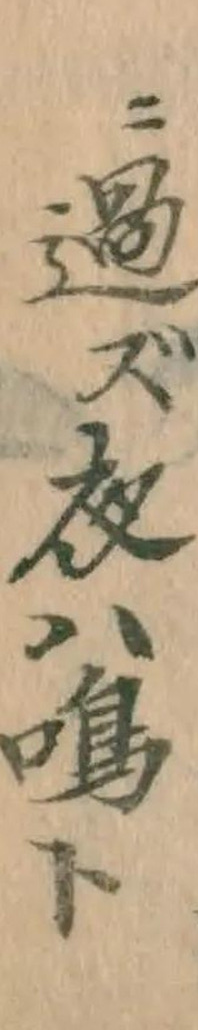ニ過ズ夜ハ鳴ト
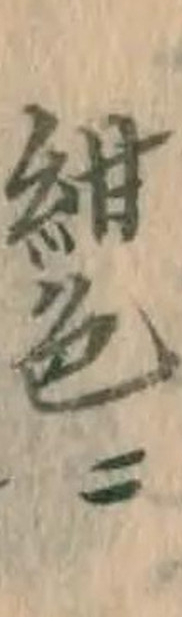紺色ニ
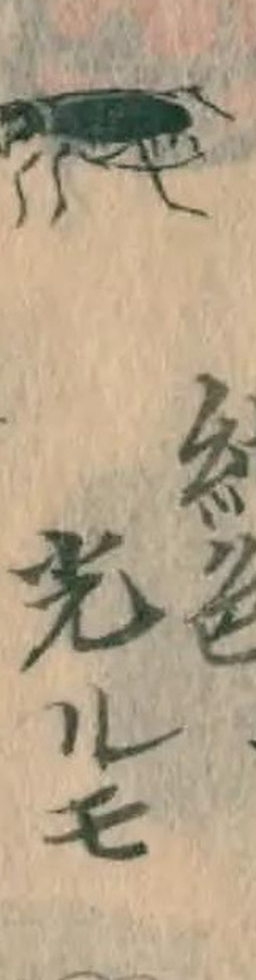光ルモ
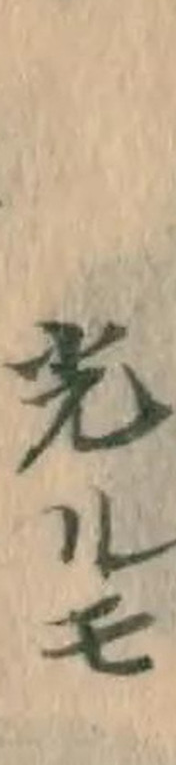光ルモ
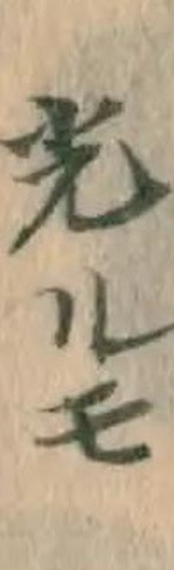光ルモ
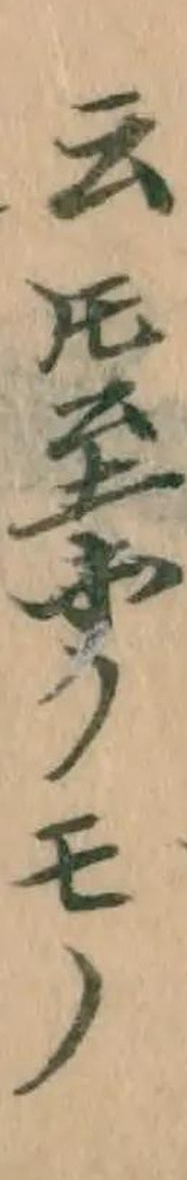云トモ至小ノモノ
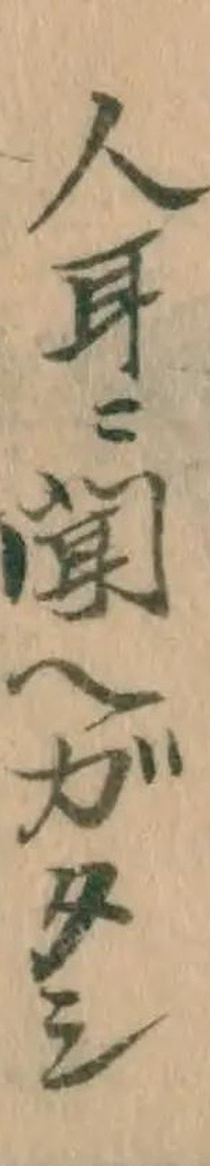人耳ニ聞ヘガタシ
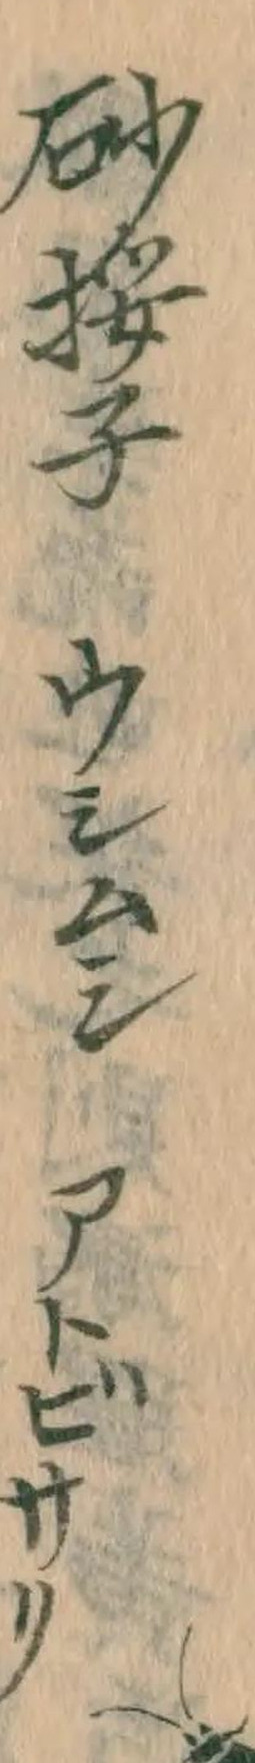砂攖子ウシムシアトビサリ
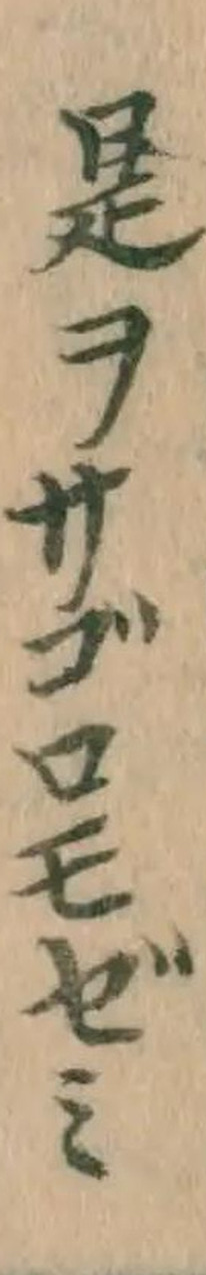是ヲサゴロモゼミ
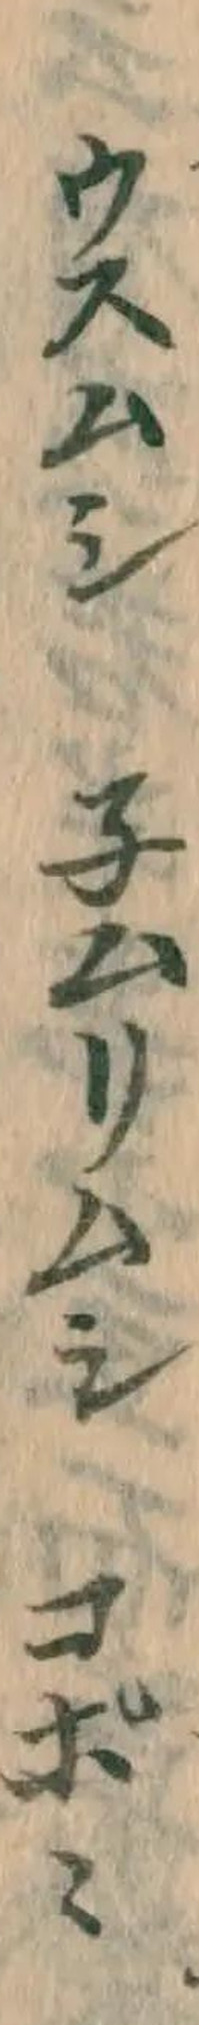ウスムシネムリムシコボ〳〵
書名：千蟲譜 3巻. [2]
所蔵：国立国会図書館 National Diet Library, JAPAN
